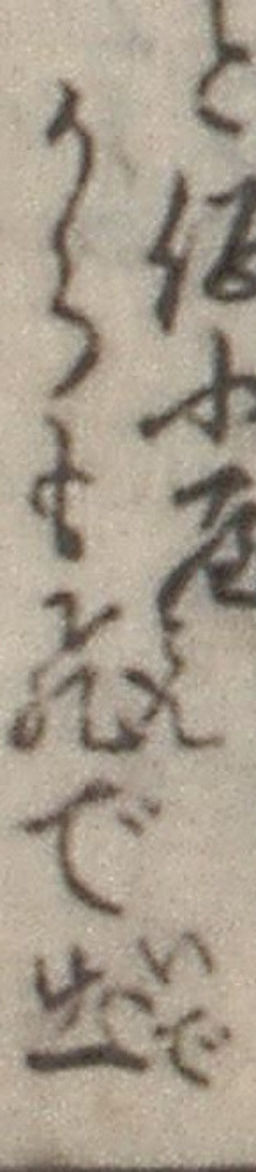からも飛で出
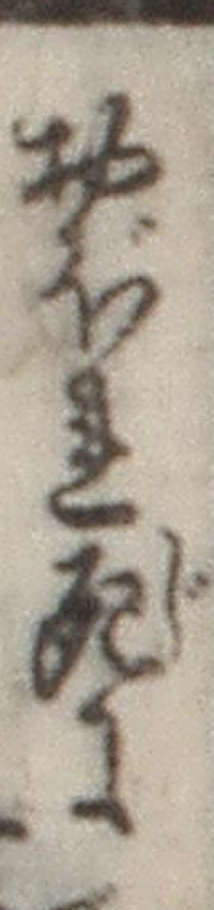おぼれ死に
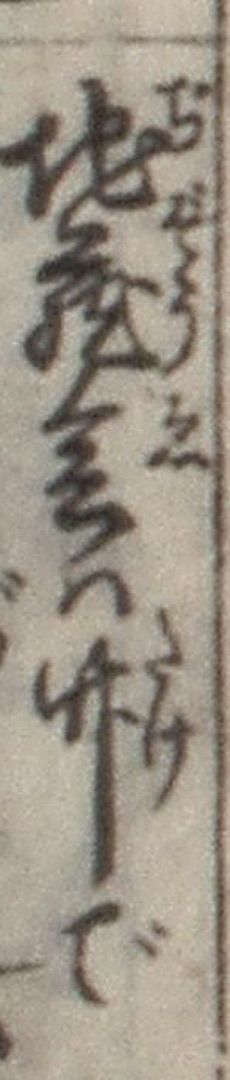地蔵会は竹で
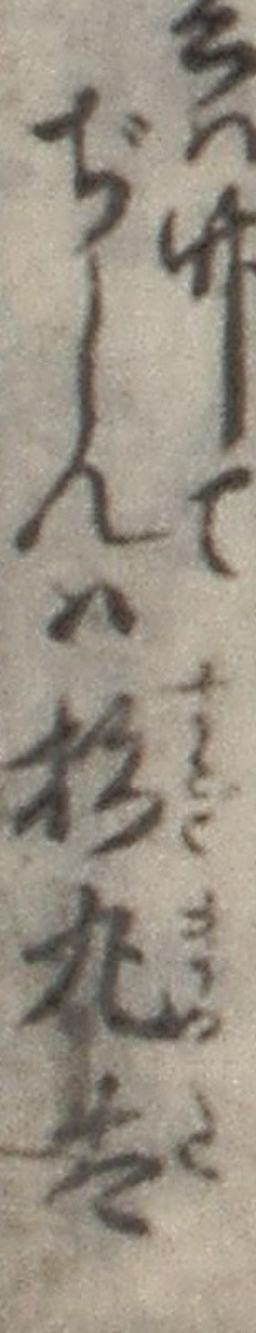ぢしんは杉丸太
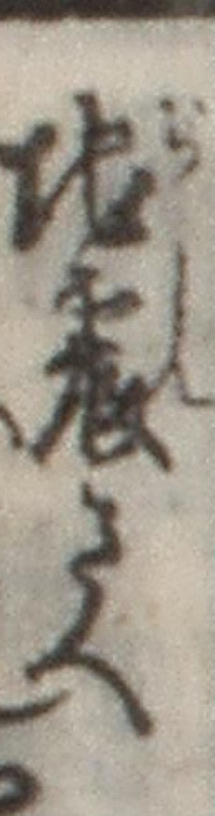地震さへ
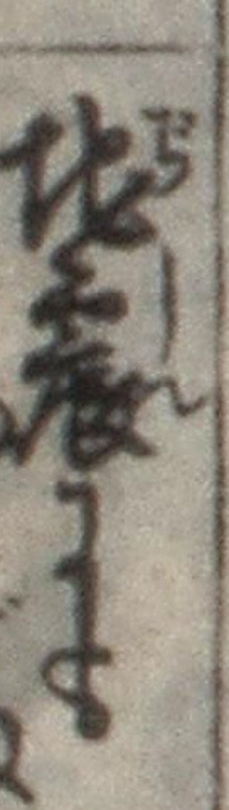地震にも
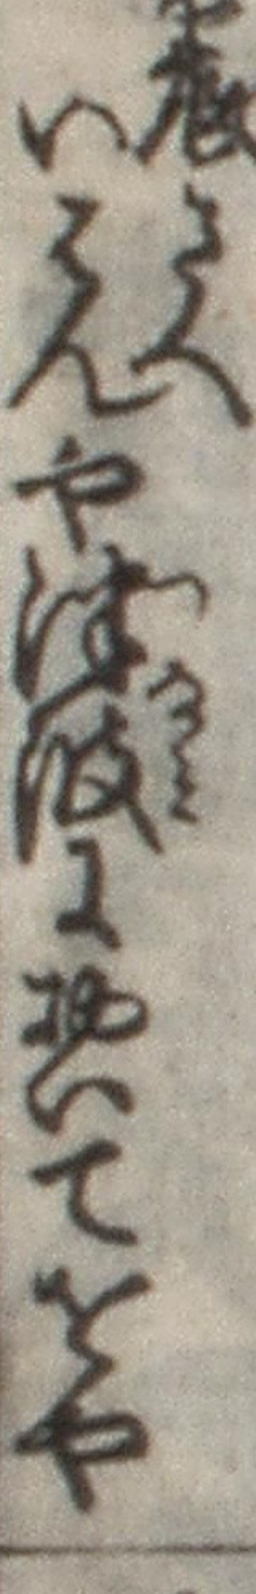いはんや津波においてをや
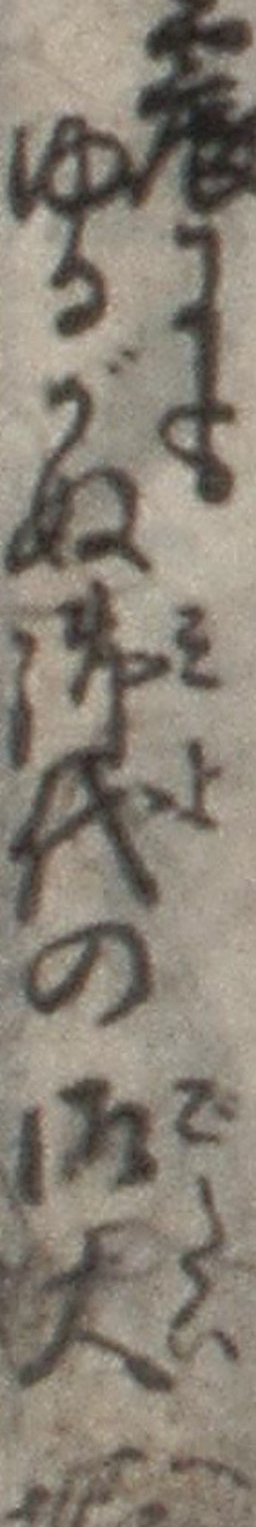ゆるがぬ御代の御大塀

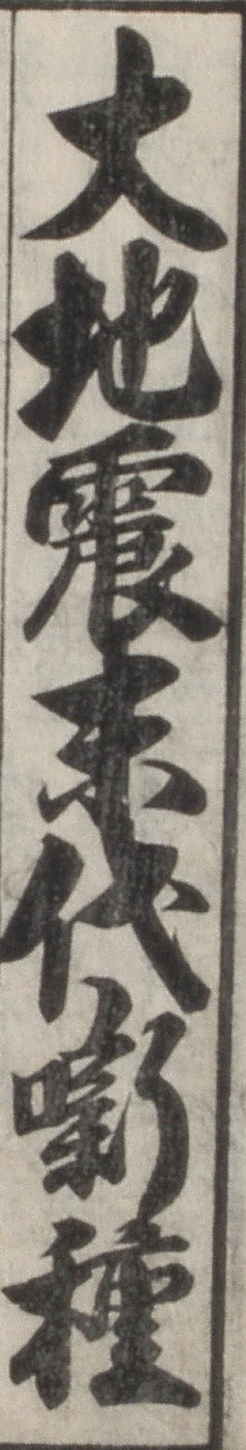大地震末代噺種
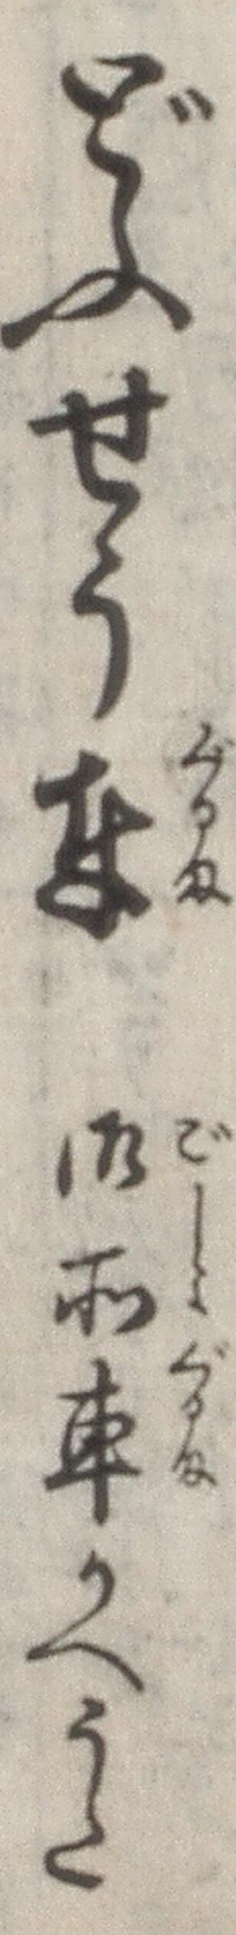どふせふ車御所車かへうた
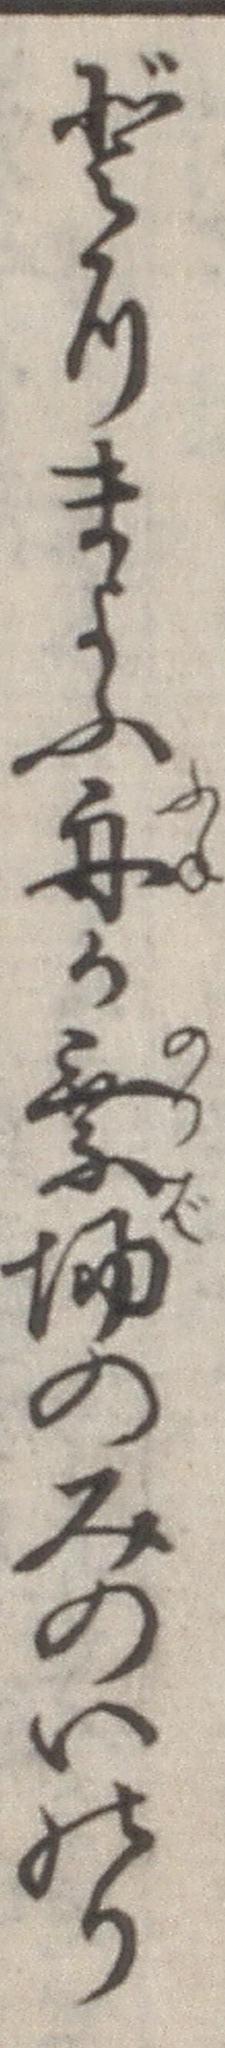どにまよふ舟か乗場のみのいのり
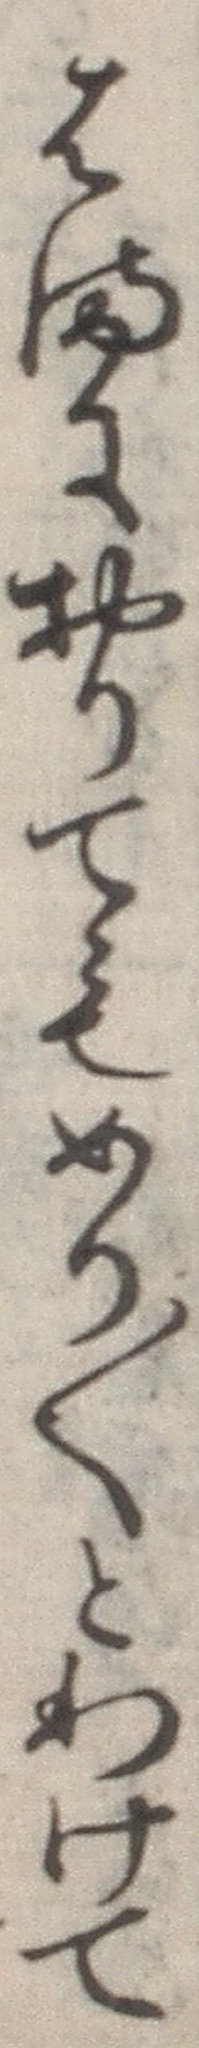はまにおりてもめり〳〵とわけて
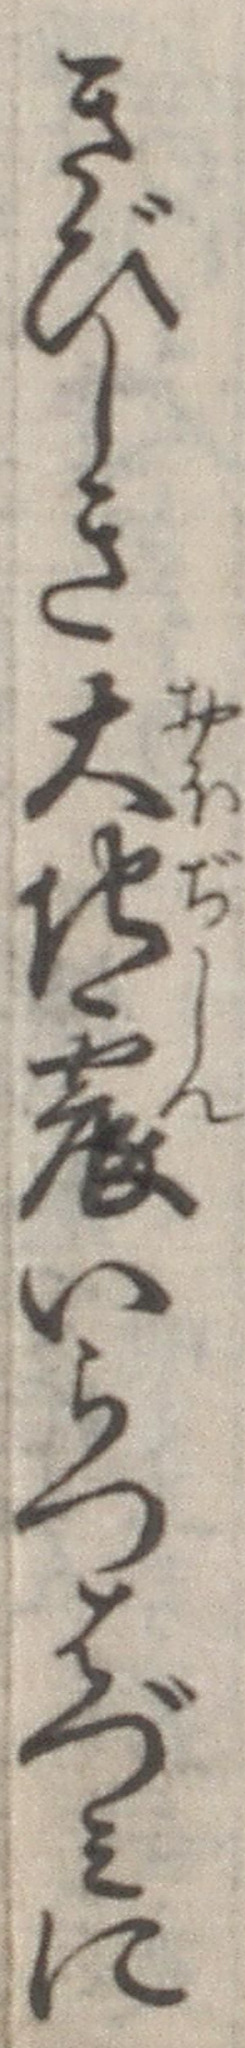きびしき大地震いらつはづみに
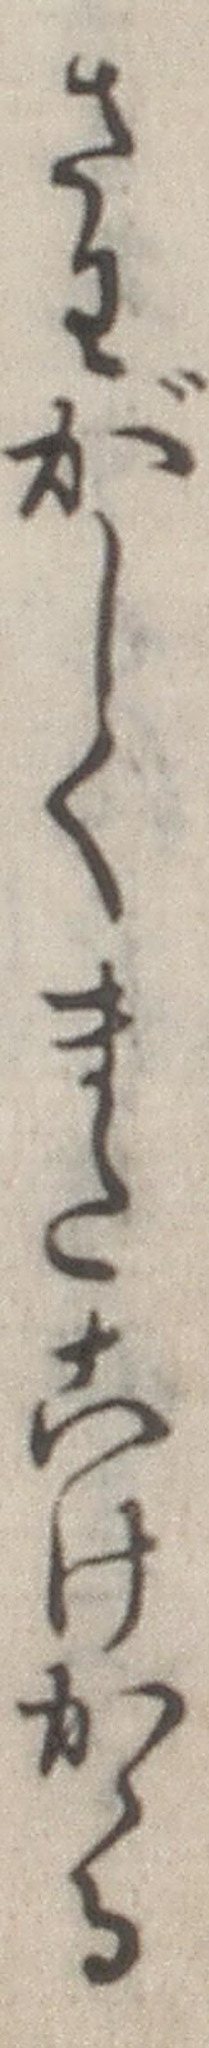さわがしくまたこけかゝる
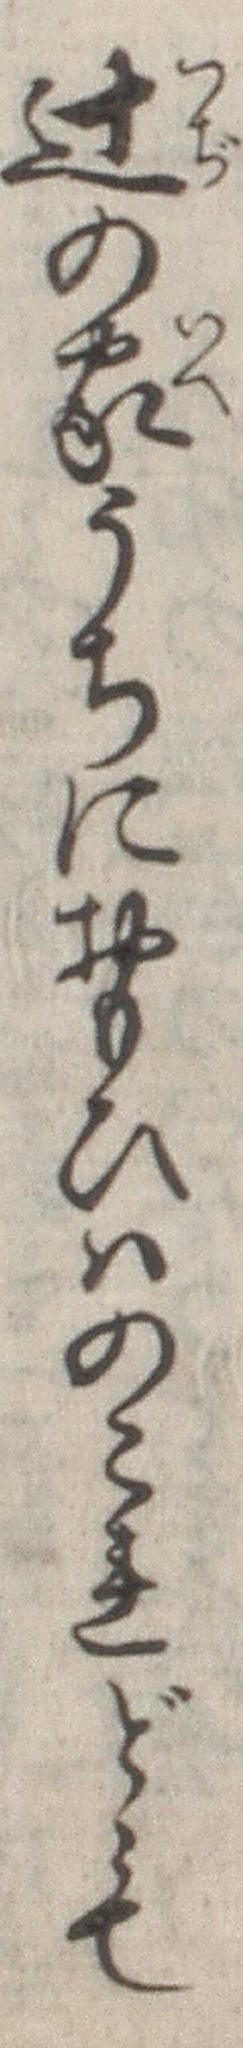辻の家うちにおもひはのこれども
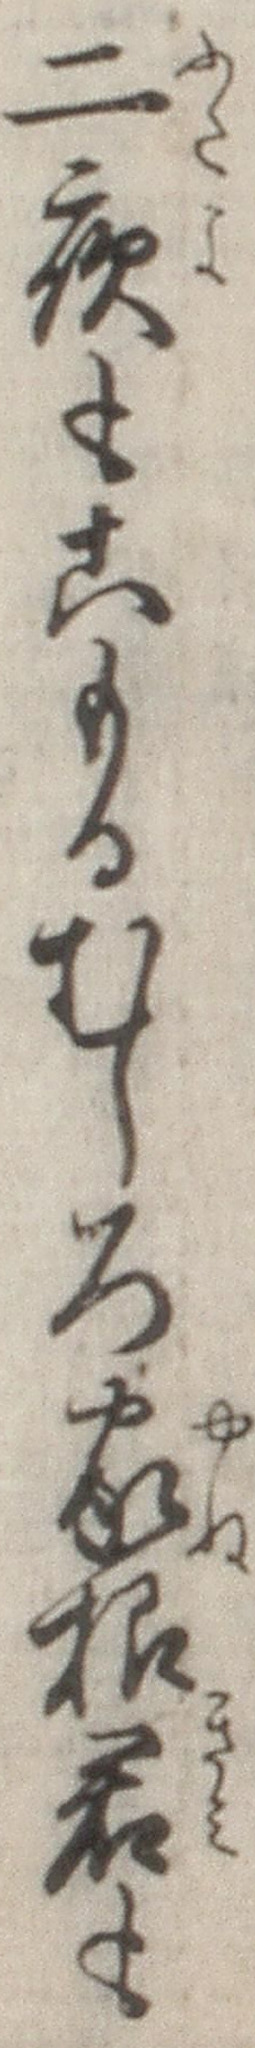二夜もこもるむしろ家根君も
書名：諸國大地震年代記　末代噺種
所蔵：東京大学地震研究所図書室 Earthquake Research Institute Library, The University of Tokyo, JAPAN
